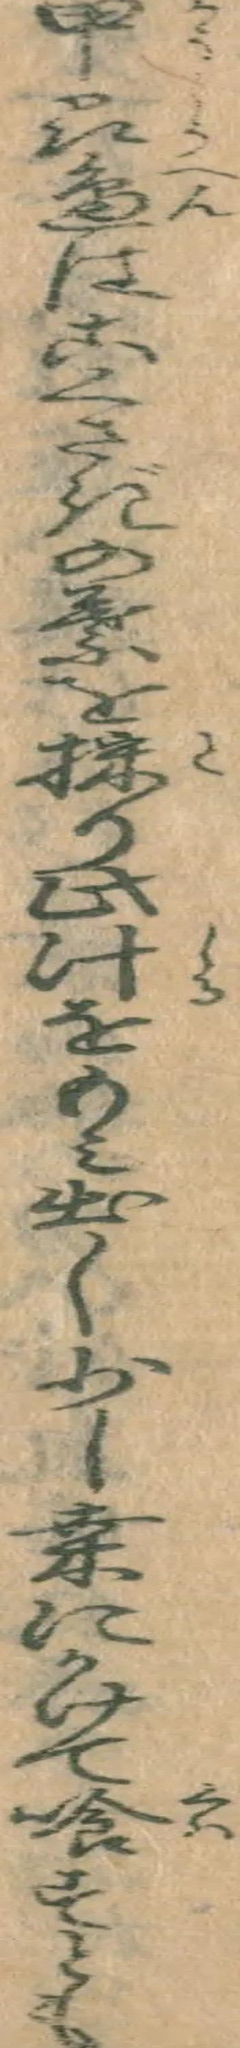甲州辺はこくさぎの葉を採り此汁をもみ出し少し桑にかけて喰すとも
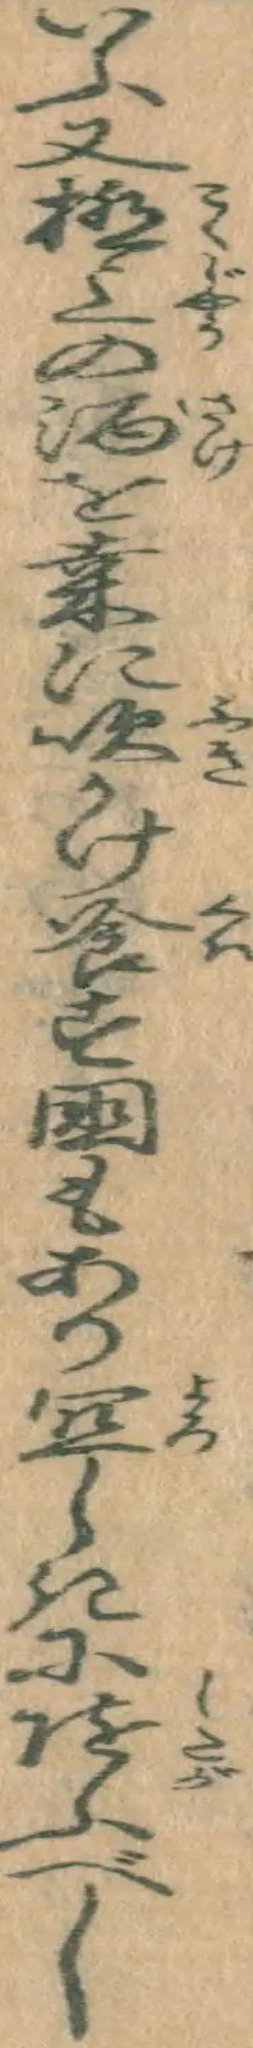いふ又極上の酒を桑に吹かけ喰す国もあり宜しきに随ふべし
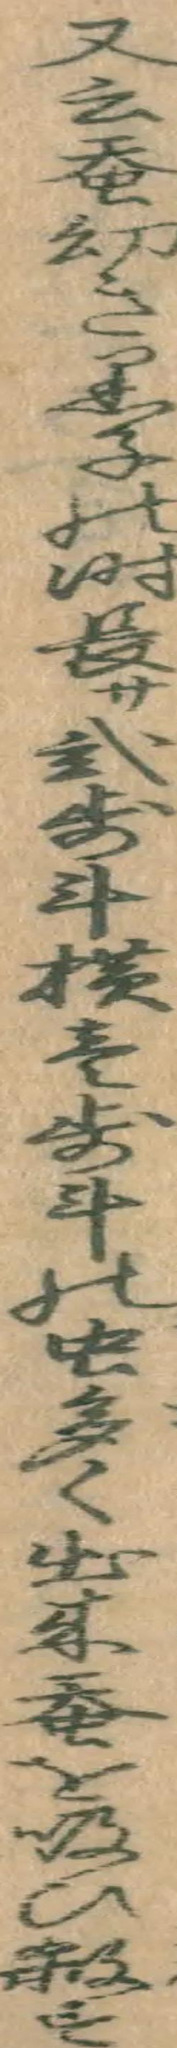又云蚕幼き黒子の時長さ弐歩斗横壱歩斗の虫多く出来蚕を吸ひ殺す
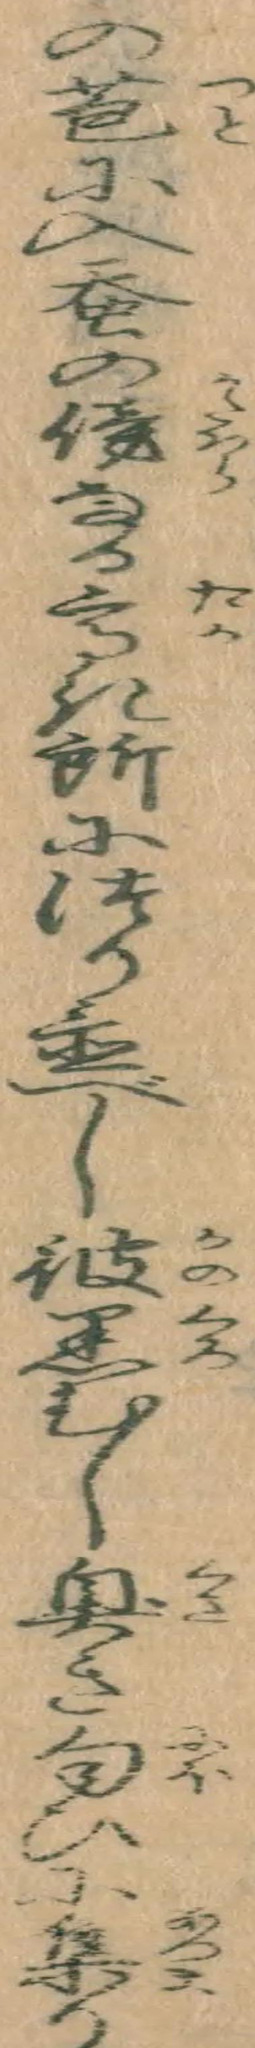の苞に入蚕の傍なる高き所につり置べし彼黒むし臭き匂ひに集り
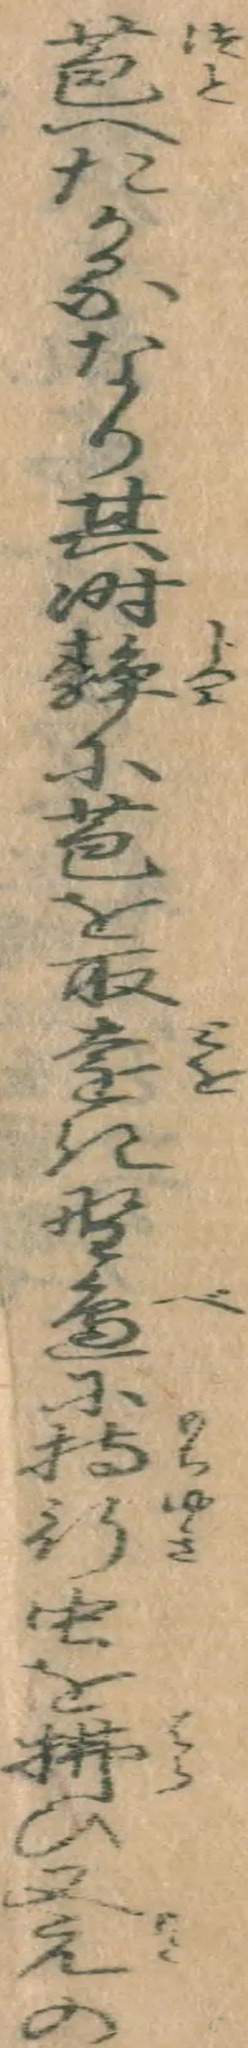苞へたかるなり其時静に苞を取遠き野辺に持行虫を払ひ又元の
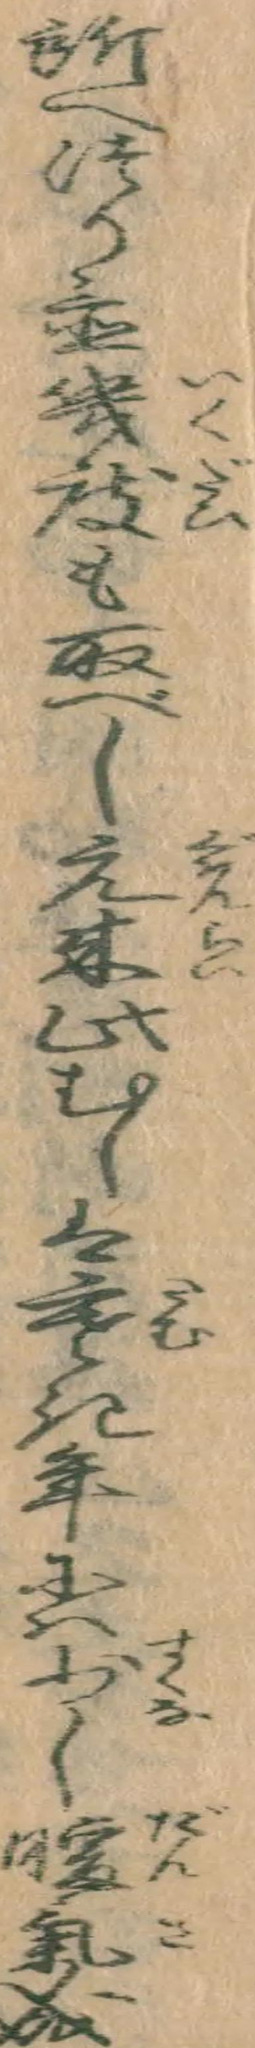所へつり置幾度も取べし元来此むしは寒き年には少し暖気成
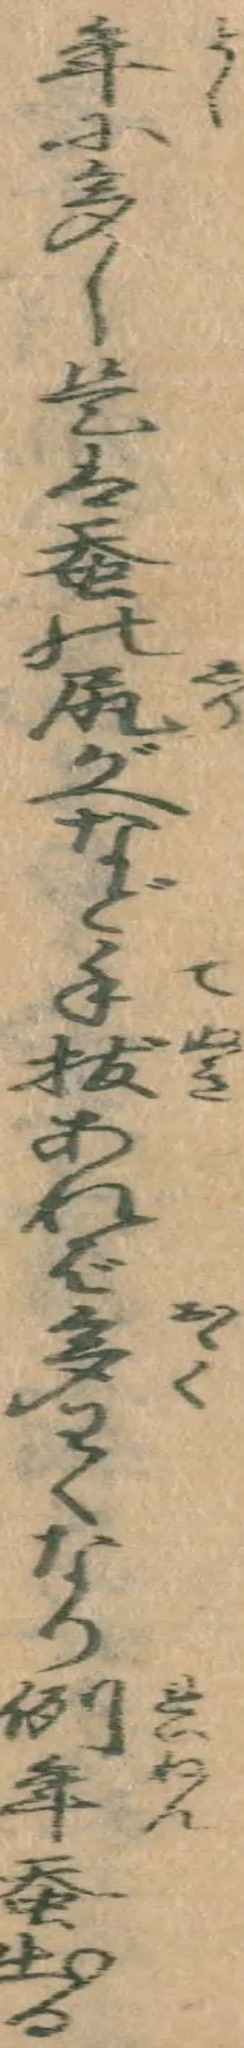年に多し是は蚕の尻がへなど手抜あれば多わくなり例年蚕出る
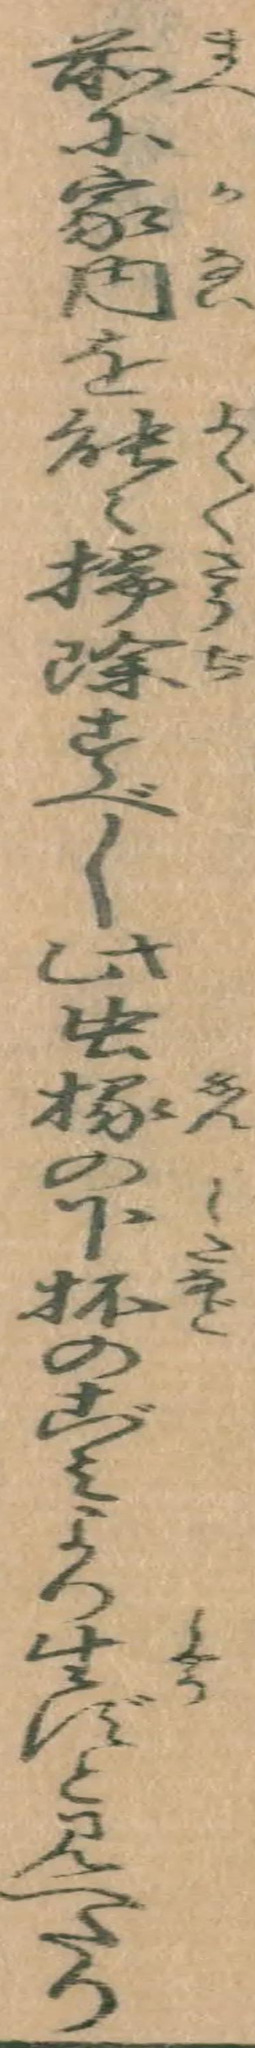前に家内を能々掃除すべし此虫椽の下抔のごみより生ずと見へたり
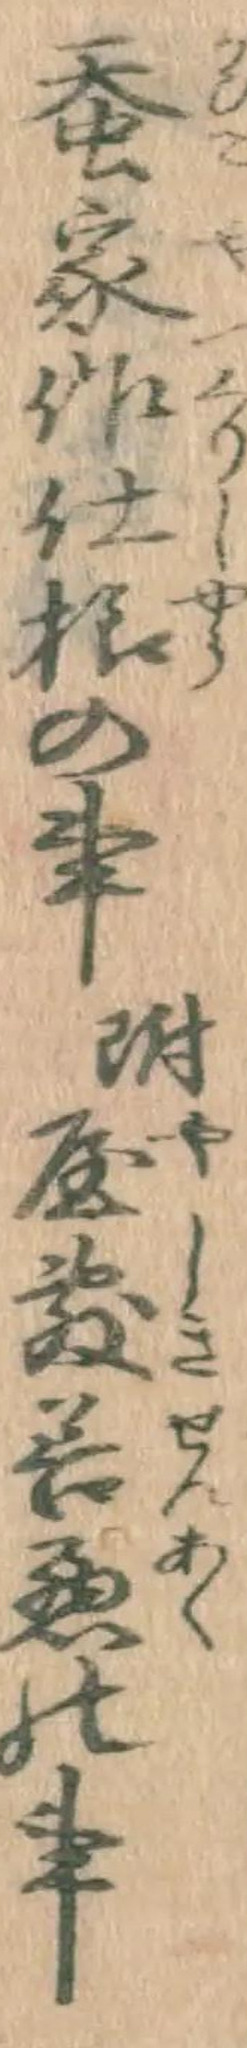蚕家作仕様の事附屋敷善悪の事
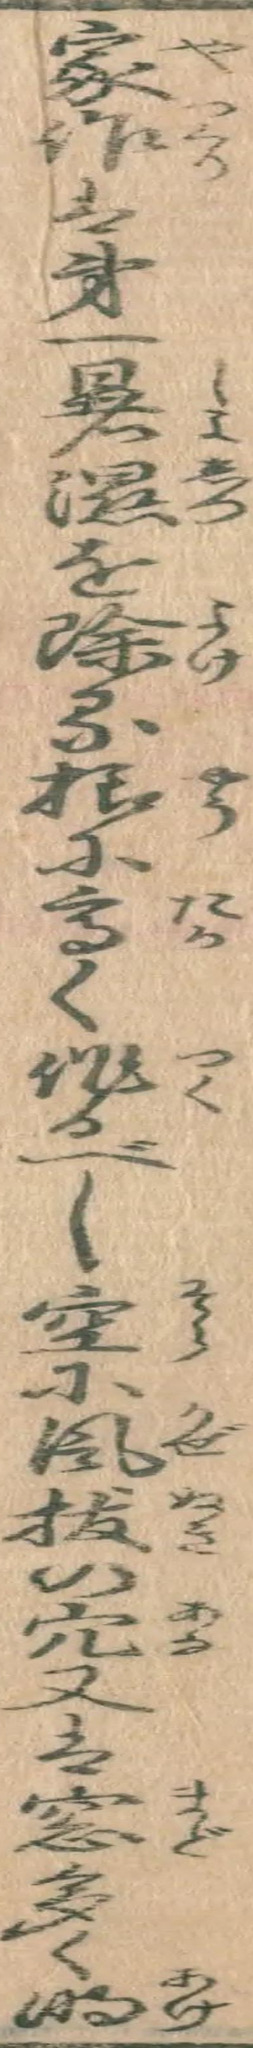家作は第一暑湿を除る様に高く作るべし空に風抜の穴又は窓多く明
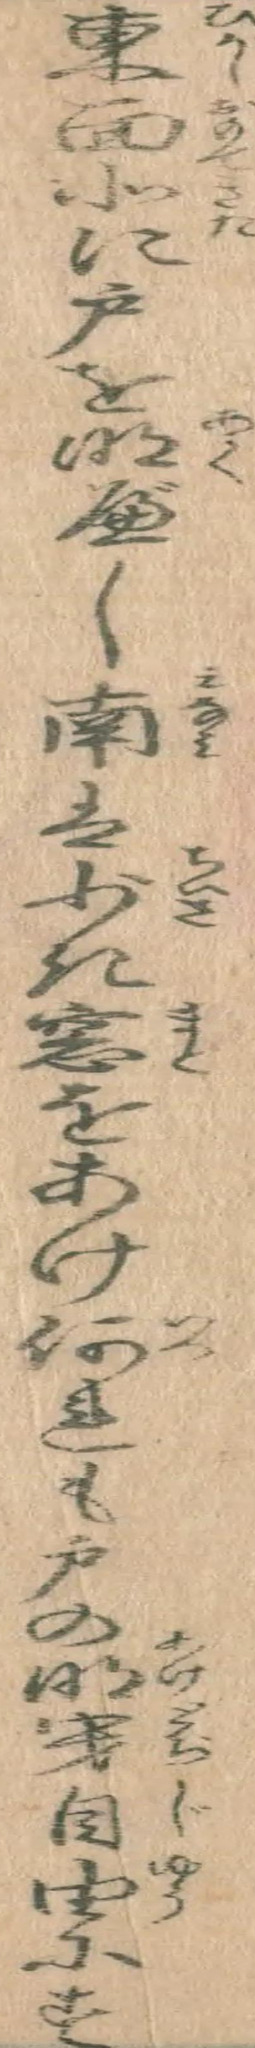東面北に戸を明べし南は少き窓をあけ何れも戸の明閉自由にす
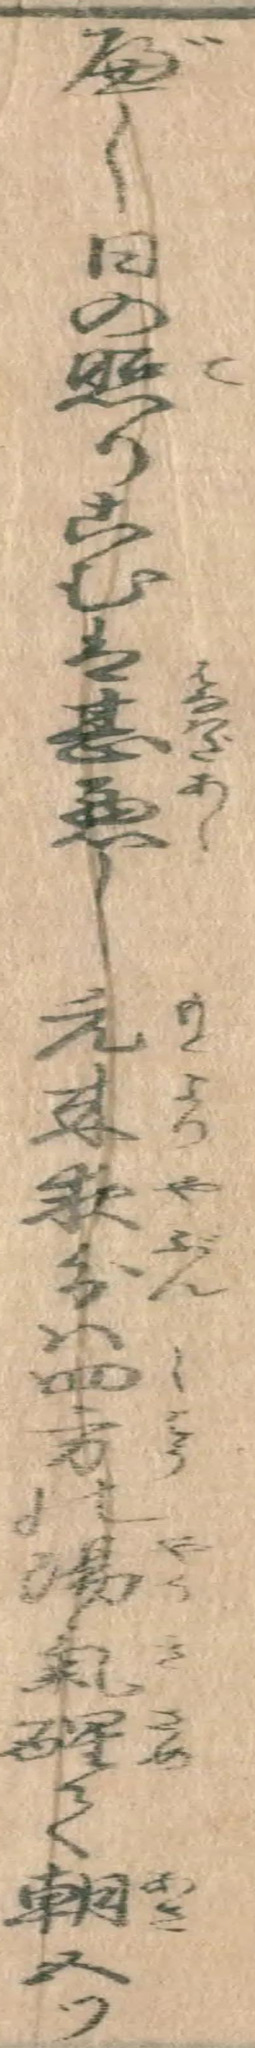べし日の照りこむは甚悪し元来夜分は四分の陽気醒て朝五ツ
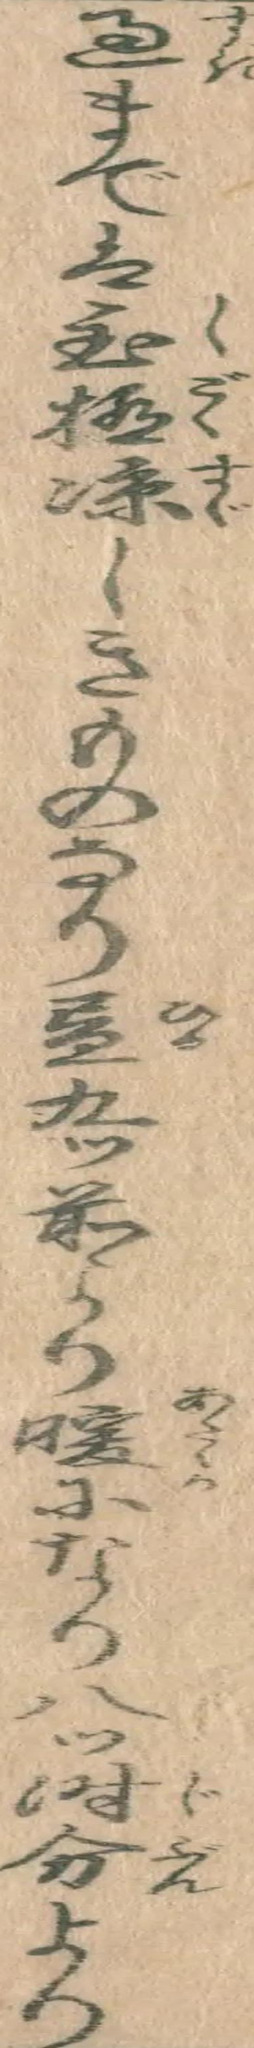過までは至極涼しきものなり昼九ツ前より暖になり八ツ時分より
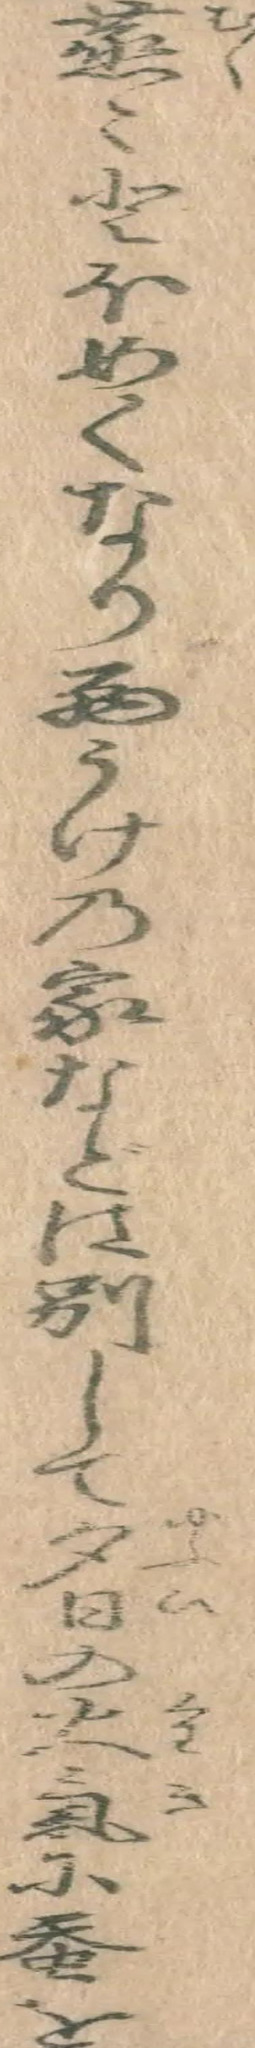蒸々とほめくなり西うけの家などは別して夕日の火気に蚕を
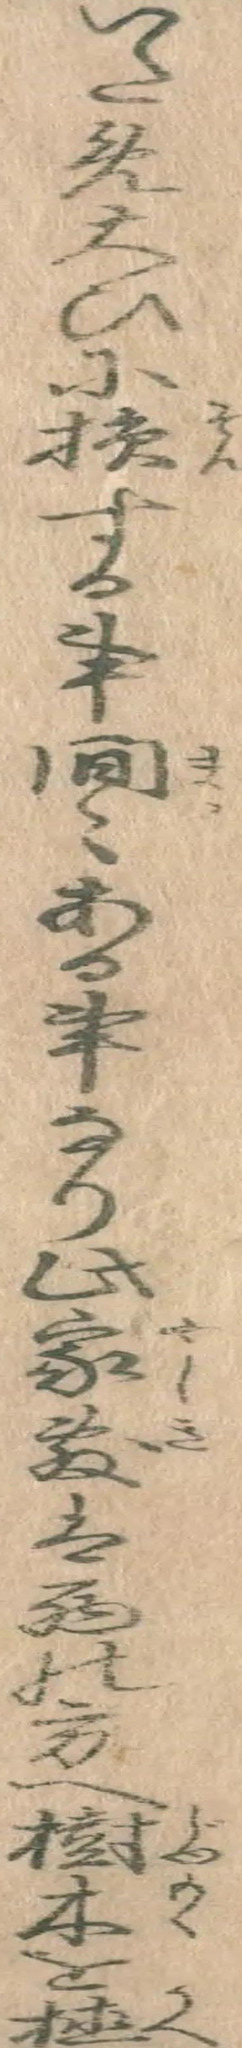いため大ひに損する事間々ある事なり此家敷は西の方へ樹木を植
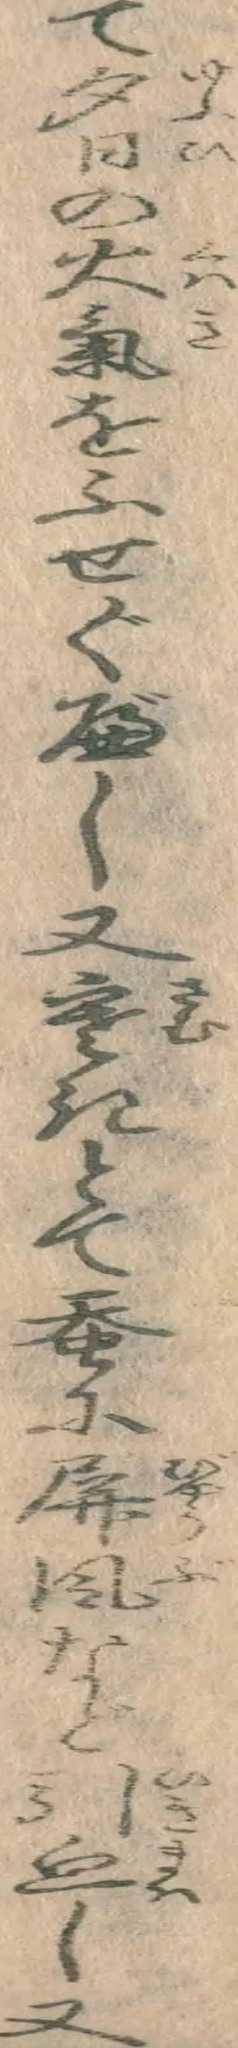て夕日の火気をふせぐべし又寒きとて蚕に屏風など引廻し又
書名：養蚕秘録 3巻. [1]
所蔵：国立国会図書館 National Diet Library, JAPAN
